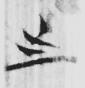之
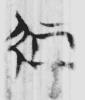凥
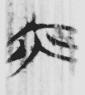亦
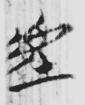𫊟
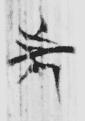先
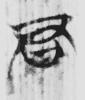君
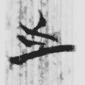之
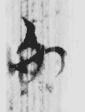力
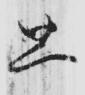也
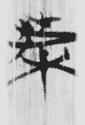枼
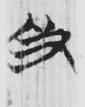及
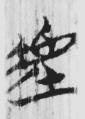𫊟
